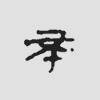不
